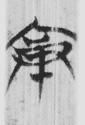{亯京}
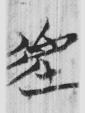𫊟
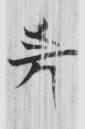先
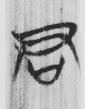君
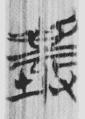襄
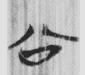公
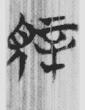親
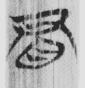冒
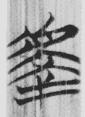{虍㚔}
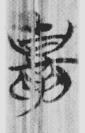{由革}
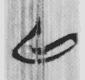㠯（以）
